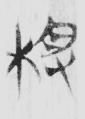{木肉又}
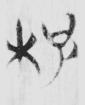枳
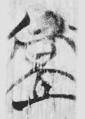當
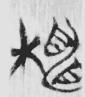{木目S目}
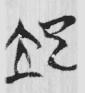{立巳}
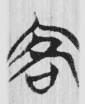客
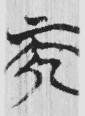而
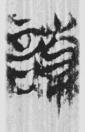{言倝}
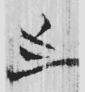之
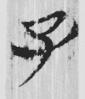子
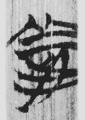義
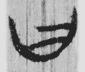曰
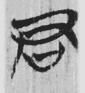君
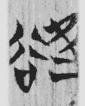欲
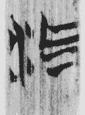汽
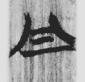丹
